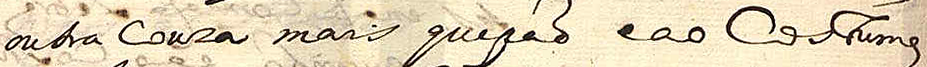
outra couza mais que paõ e ao Costume
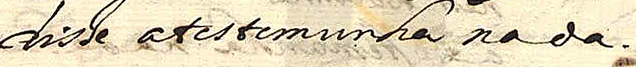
disse a testemunha nada.
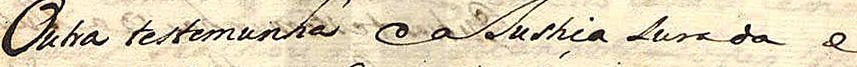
Outra testemunha da Iustiça iurada e
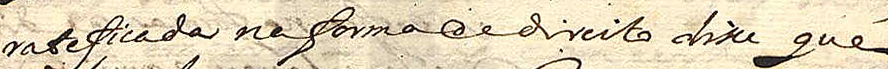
rateficada na forma de direito disse que
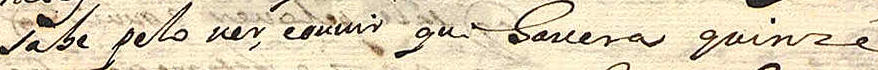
sabe pelo uer, e ouuir que hauera quinze
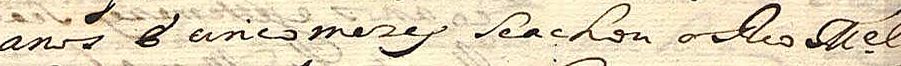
anos & cinco mezes se achou o Reo M.el
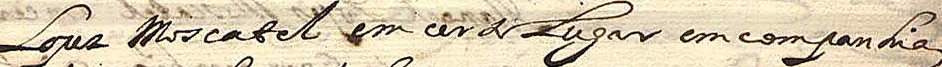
Lopez Moscatel em certo Lugar em companhia
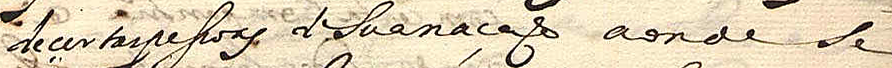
de çertas pessoas de Sua naçaõ aonde se
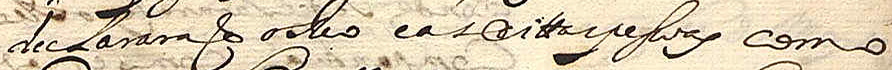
decLararaõ o Reo e as dittas pessoas como
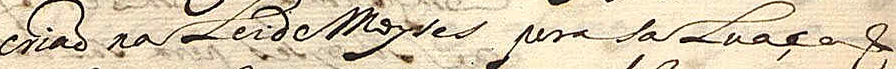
crião na Lei de Moyses, pera saLuaçaõ
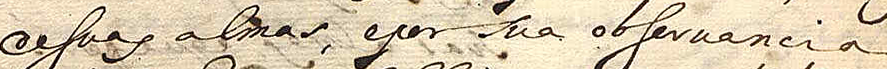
de suas almas, e por sua obseruancia
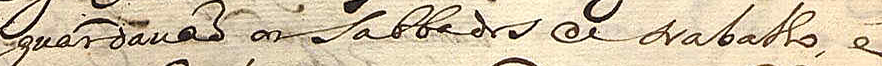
guardauaõ os Sabbados de trabalho, e
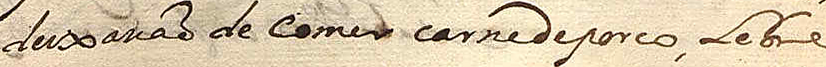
deixauão de comer carne de porco, Lebre
